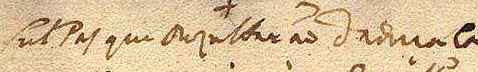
CulPas que Rezultarão da deuaça
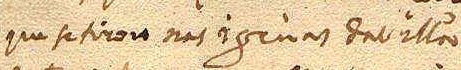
que se tirou nas igreias da villa
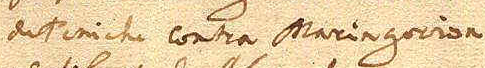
de Peniche contra Maria gorioa
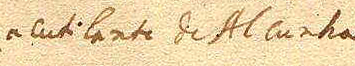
a cutilante de Alcunha
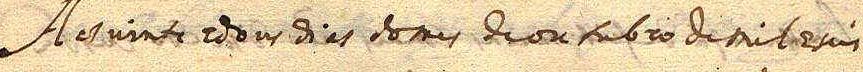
Aos uinte E dous dias do mes de outubro de mil E seis
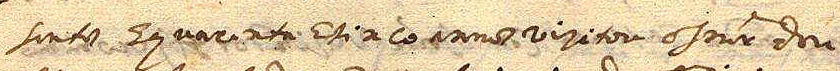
sentos E quarenta E sinco annos vizitou o snor̄ dou
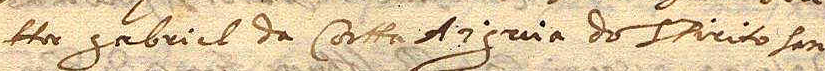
ttor gabriel da Costta A igreia do SPirito san
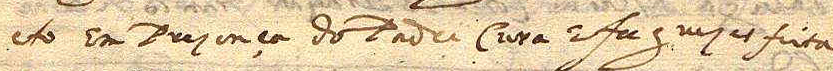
cto Em Prezença do Padre Cura E freguezes feita
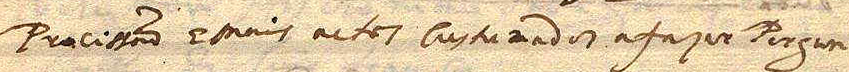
Procissaõ E mais actos custumados a fazer Pergun
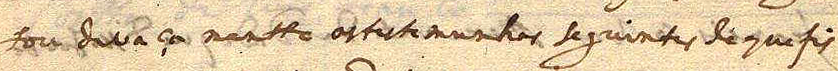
tou devaçamentte as testemunhas seguintes de que fis
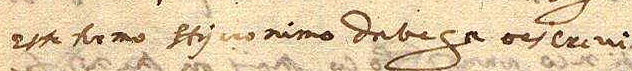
Este termo Hyeronimo da vega o escreui
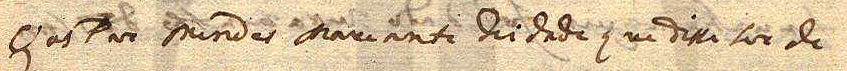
GasPar Mendes Mareante de idade que disse ser de
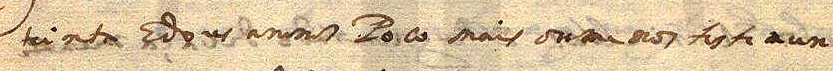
trinta E dous annos Poco mais ou menos testemun
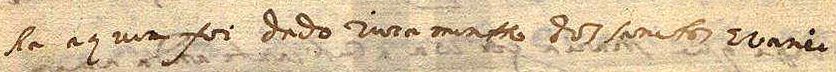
ha a quem foi dado iuramentto dos sanctos Evanie
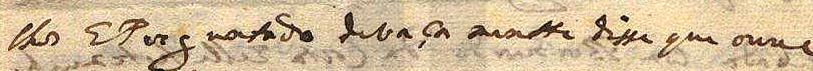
lhos E Perguntado devaçamentte disse que ouue
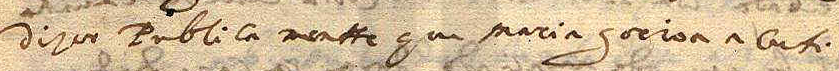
dizer Publicamentte que maria gorioa a cuti
